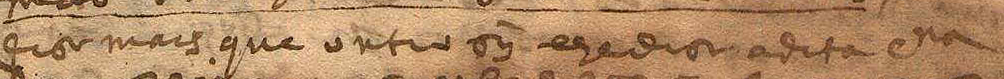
dise mais que outrosy lhe dise a dita cna
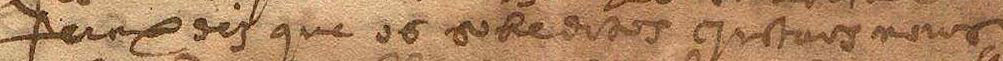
fernādez que os sobreditos cristaos nouos
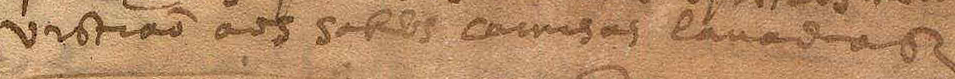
vistiaõ aos sabdos camisas lauadas
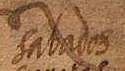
sabados
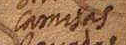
camisas
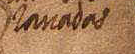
lauadas
